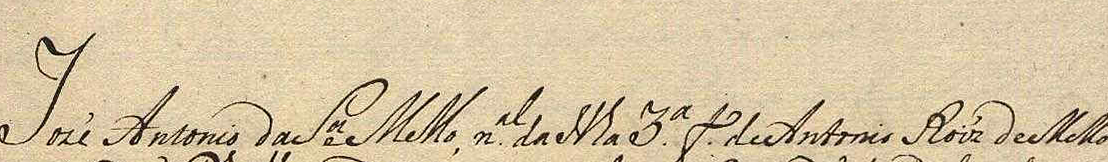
Iozé Antonio da S.a e Mello, n.al da Ilha 3.a f.o de Antonio Roiz̄ de Mello
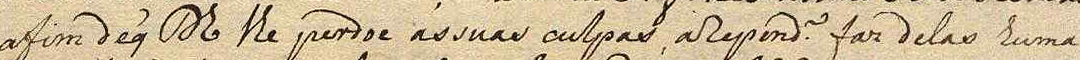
afim de q̄ D̄ lhe perdoe as suas culpas, aRepend.o faz delas huma
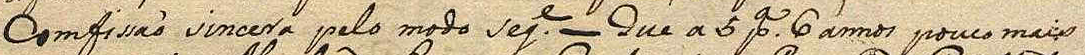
Comfissaõ sincera pelo modo seg.e = Que a 5 p.a 6 annos pouco mais
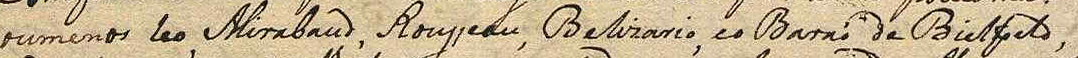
ou menos leo Mirabaud, Rousseau, Belizario, e o Baraõ de Bielfacto,
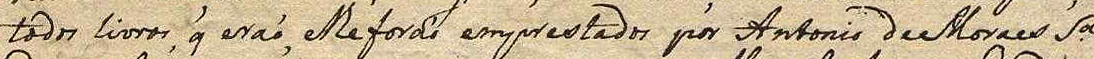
todos livros, q̄ eraõ, e lhe foraõ emprestados por Antonio de Moraes S.a
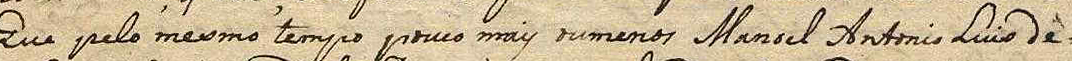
Que pelo mesmo tempo pouco mais ou menos Manoel Antonio Luis de
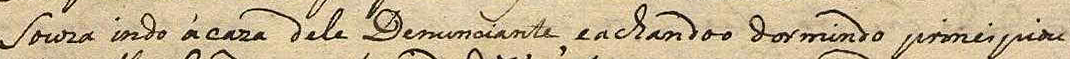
Souza indo á caza dele Denunciante, e achandoo dormindo principiou
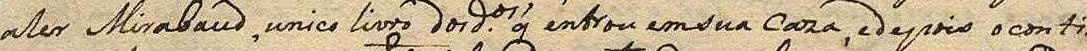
a ler Mirabaud, unico livro dos d.os q̄ entrou em sua Caza, e depois o conti
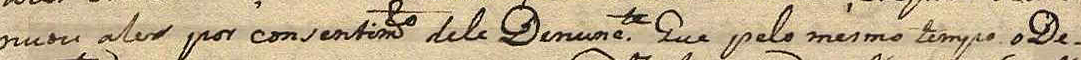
nuou a ler por consentim.to dele Denunc.te Que pelo mesmo tempo o De
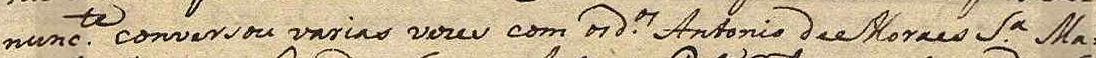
nunc.te conversou varias vezes com os d.os Antonio de Moraes S.a Ma
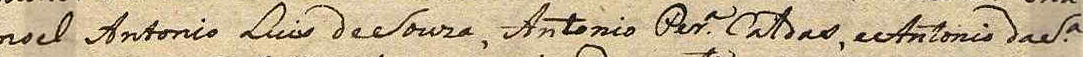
noel Antonio Luis de Souza, Antonio Per.a Caldas, e Antonio da S.a
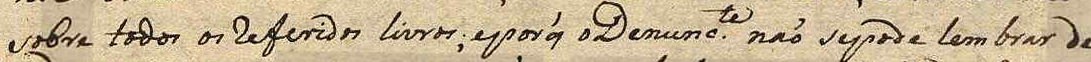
sobre todos os Referidos livros; e porq̄ o Denunc.te naõ se pode lembrar de
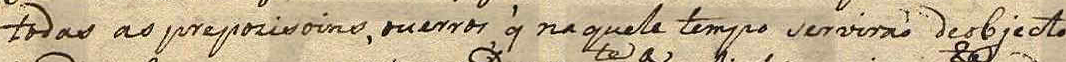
todas as prepozisoins, ou erros q̄ naquele tempo serviraõ de objecto
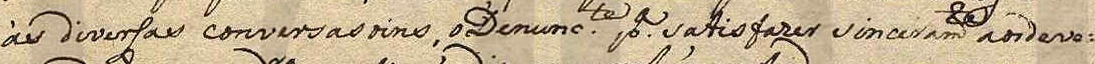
às diversas conversasoins, o Denunc.te p.a satisfazer sinceram.te aos deve
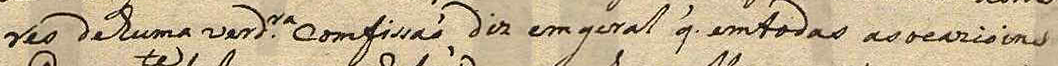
res de huma verd.ra comfissaõ, diz em geral q̄ em todas as ocazioins
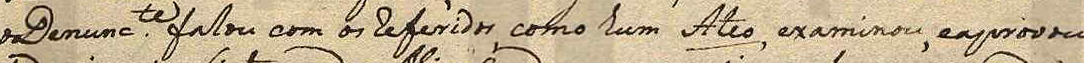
o Denunc.te falou com os Referidos, como hum Ateo, examinou, e aprovou
